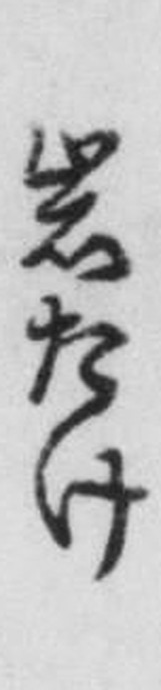岩たけ
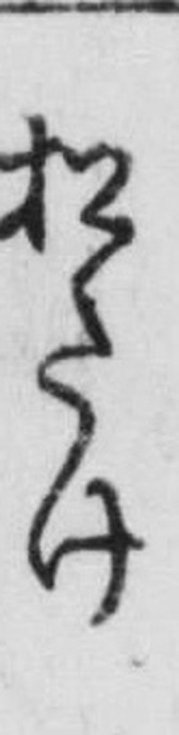松たけ
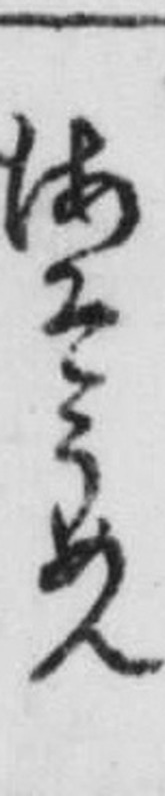梅そうめん
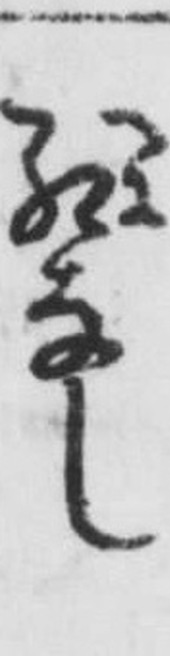紅なし
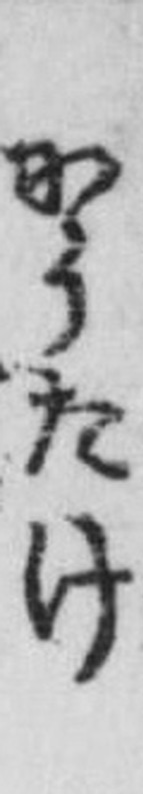かうたけ
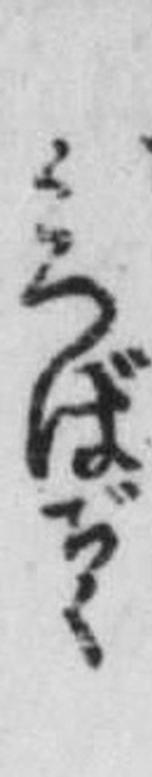みつばぢく
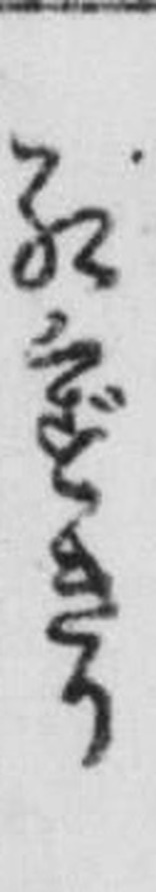紅くずきり
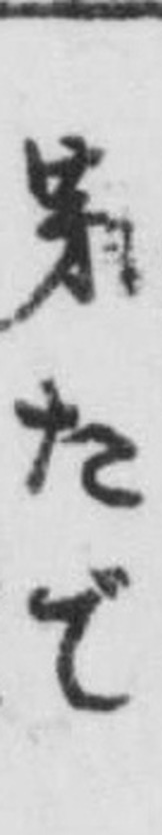芽たて
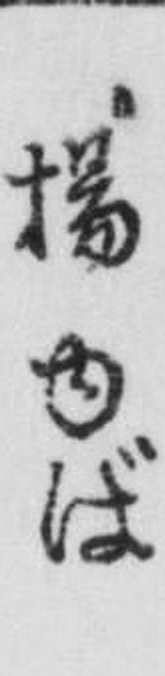揚ゆば
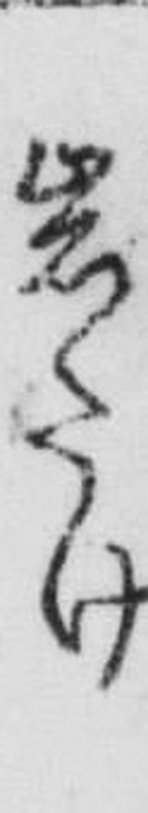岩たけ
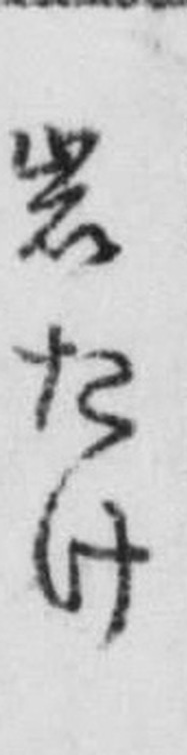岩たけ
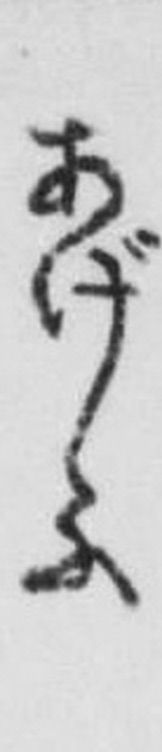あげふ
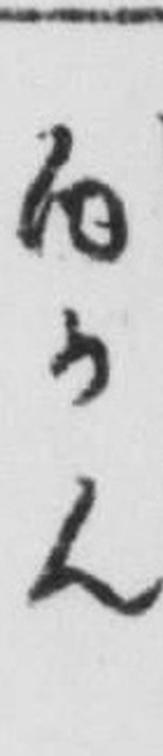白かん
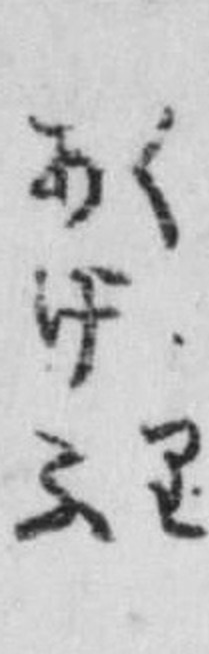あげふ
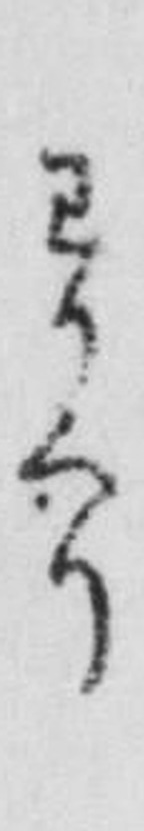わりくり
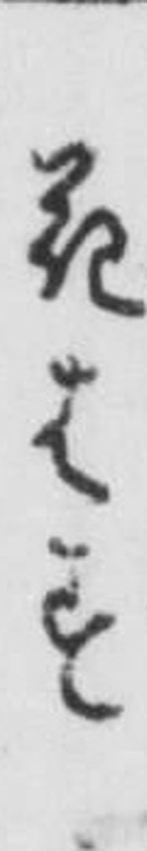花はす
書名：精進魚類間合料理/早速庖丁
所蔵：大阪府立大学学術情報センター 国文学研究資料館
